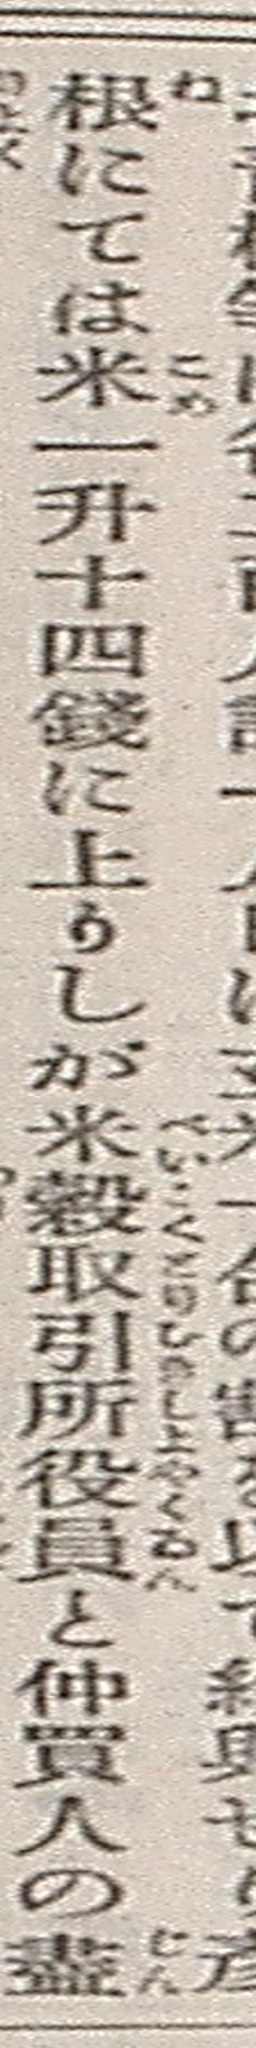根にては米一升十四銭に上りしが米穀取引所役員と仲買人の尽
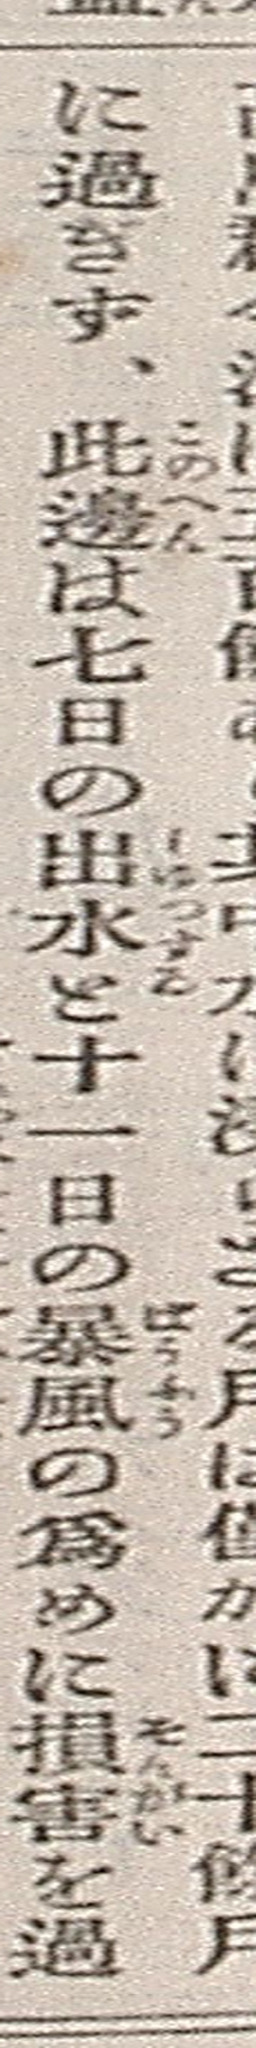に過ぎず、此辺は七日の出水と十一日の暴風の為めの損害を過
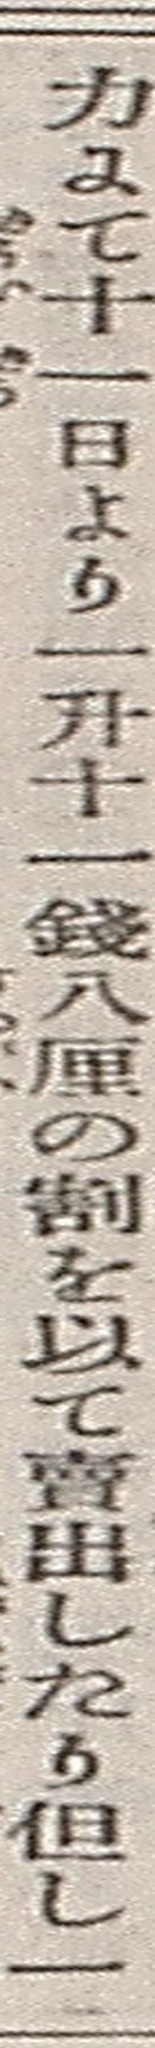力にて十一日より一升十一銭八厘の割を以て売出したり但し一
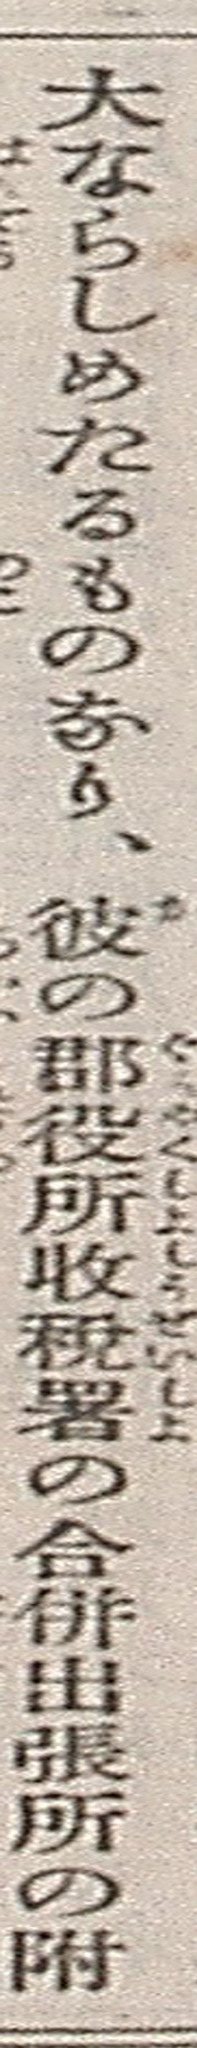大ならしめたるものなり、彼の郡役所収税署の合併出張所の附
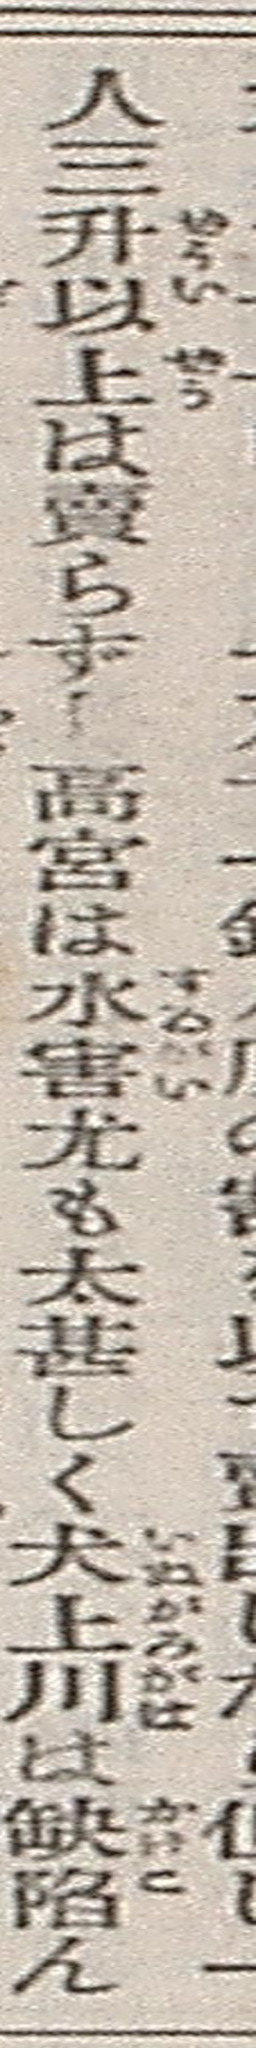人三升以上は売らずし高宮は水害尤も太甚しく犬上川は缺陥ん
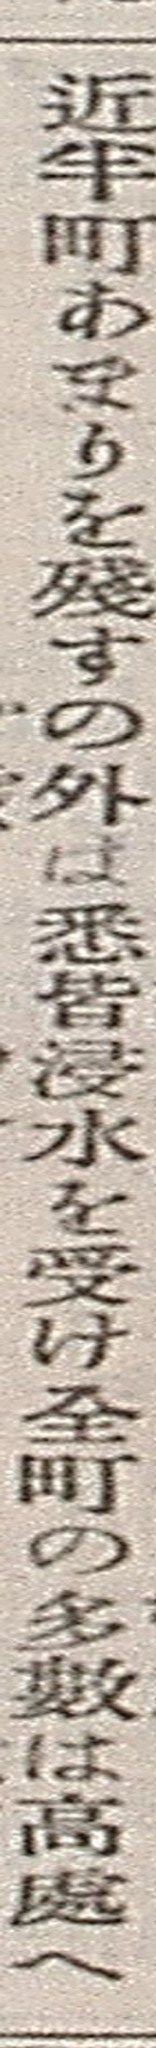近半町あまりを残すの外は悉皆浸水を受け同町の多数は高処へ
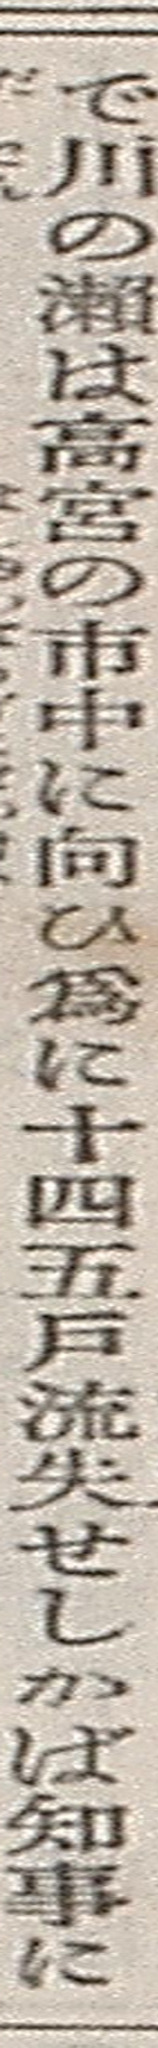で川の瀬は高宮の市中に向ひ為に十四五戸流失せしかば知事に
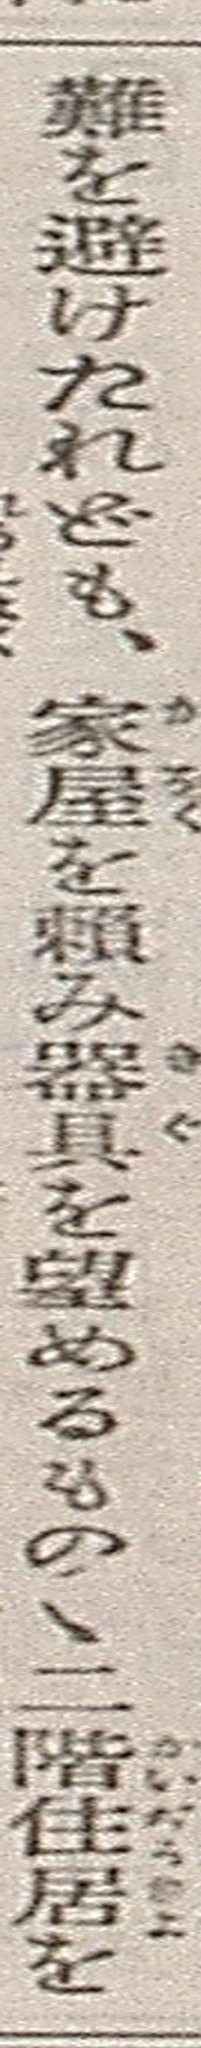難を避けたれども、家屋を頼み器具を望めるものゝ二階住居を
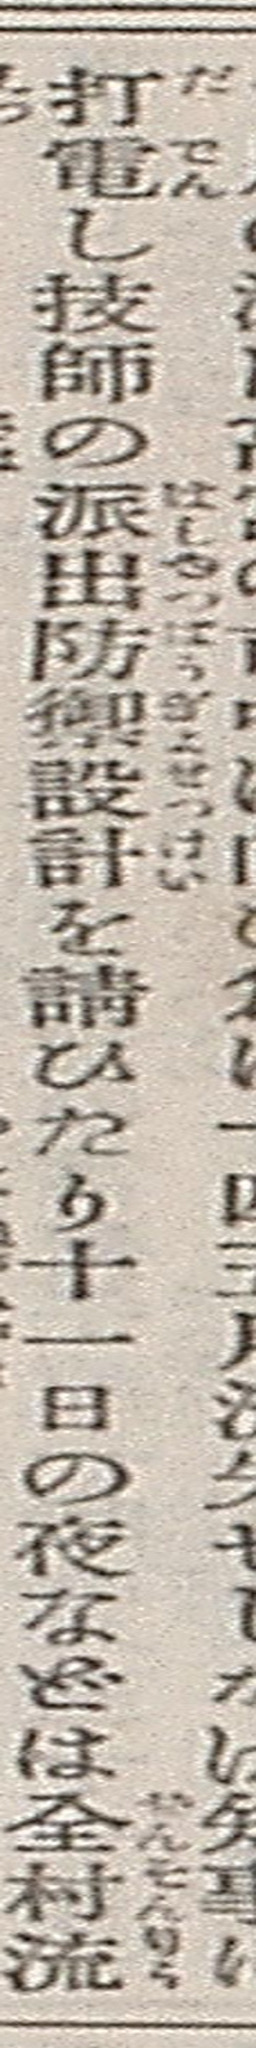打電し技師の派出防禦設計を請ひたり十一日の夜などは全村流
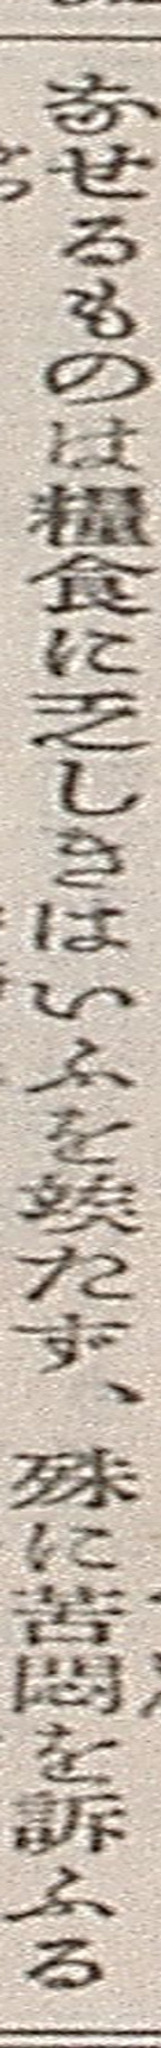なせるものは糧食に乏しきはいふを竢たず、殊に苦悶を訴ふる
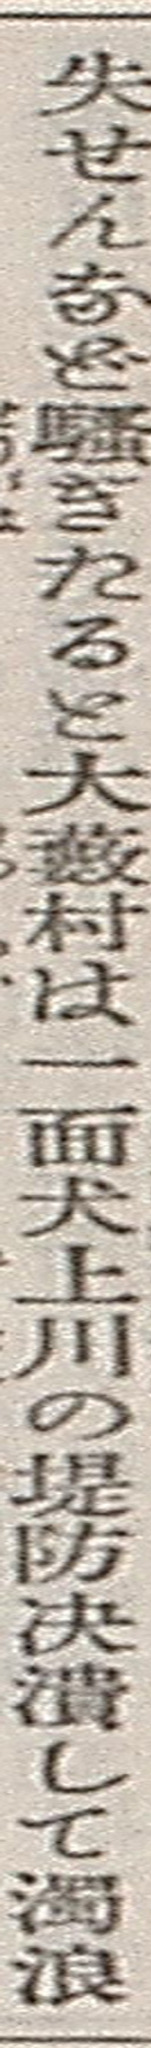失せんなど騒ぎたると大藪村は一面犬上川の堤防决潰して濁浪
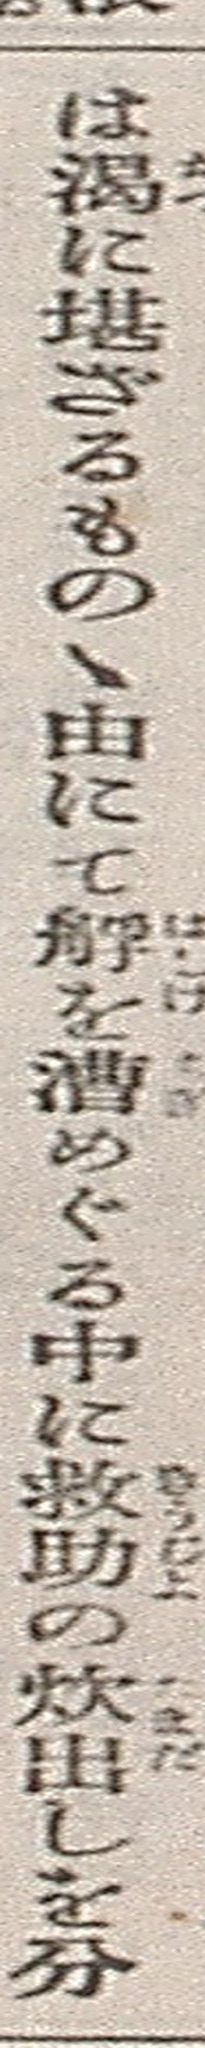は渇に堪ざるものゝ由にて艀を漕めぐる中に救助の炊出しを分
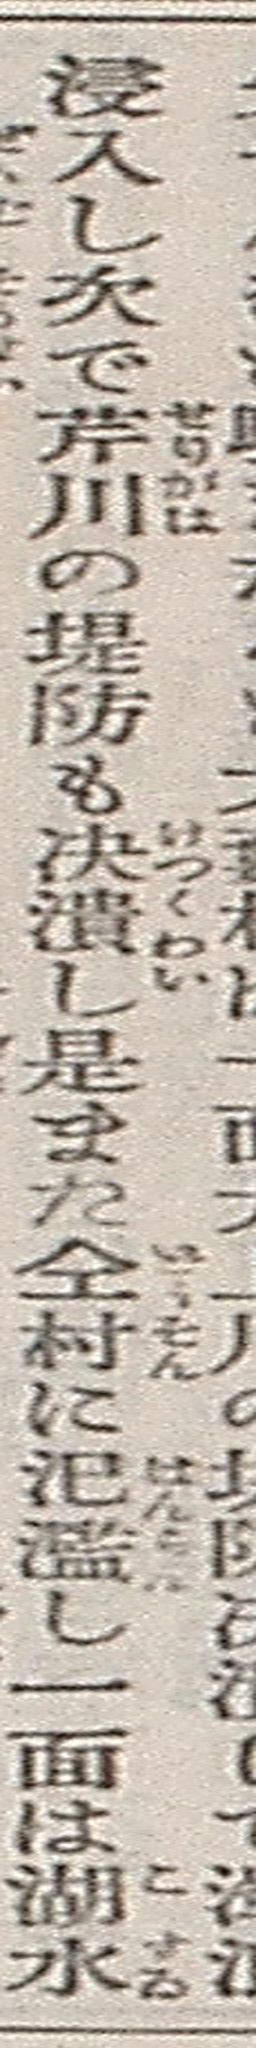侵入し次で芹川の堤防も决潰し是また同村に氾濫し一面は湖水
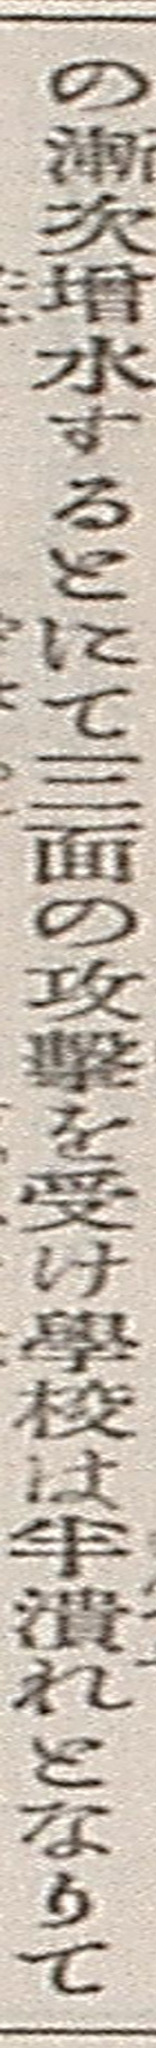の漸次増水するとにて三面の攻撃を受け學校は半潰れとなりて
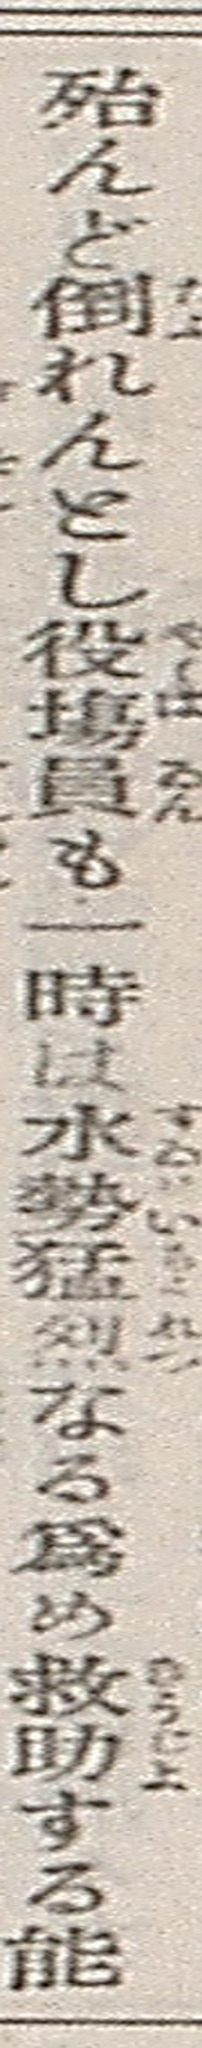殆んど倒れんとし役場員も一時は水勢猛烈なるた為め救助する能
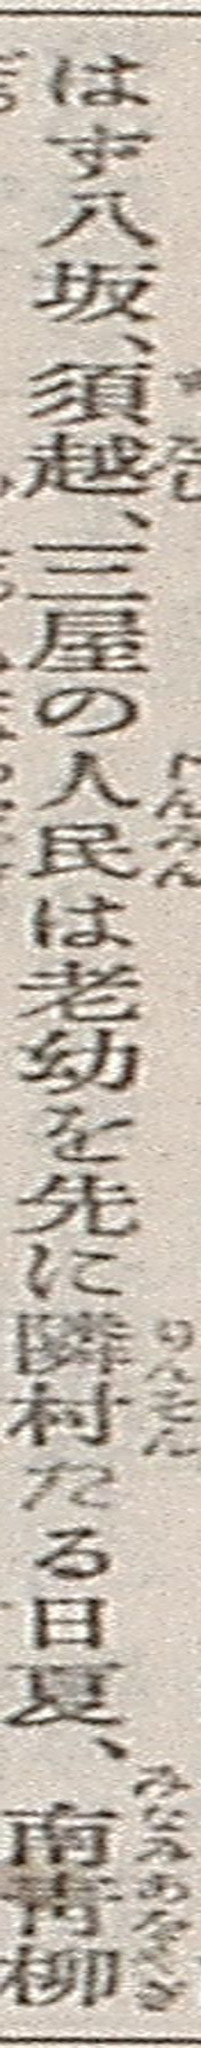はず八坂、須越、三屋の人民は老幼を先に隣村たる日夏、南青柳
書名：風俗畫報臨時増刊第百二十八號　洪水被害録（下）
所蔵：東京大学地震研究所図書室 Earthquake Research Institute Library, The University of Tokyo, JAPAN
